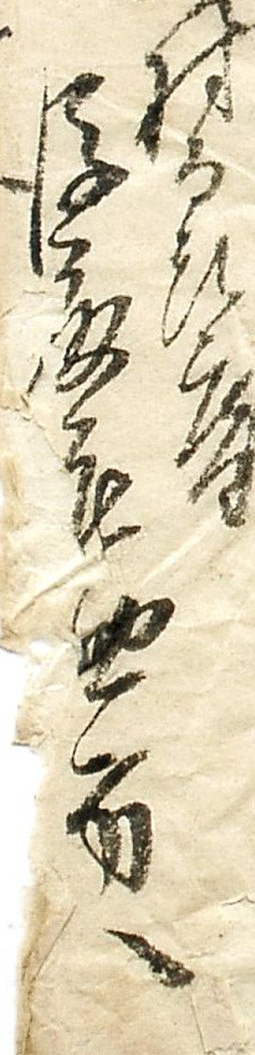後藤庄助方へ

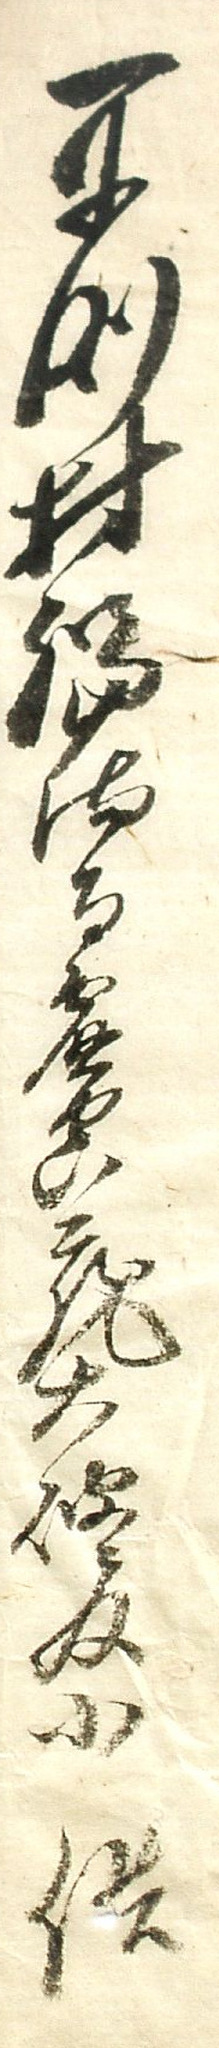早渕村福満寺虚空蔵大破ニ及小供
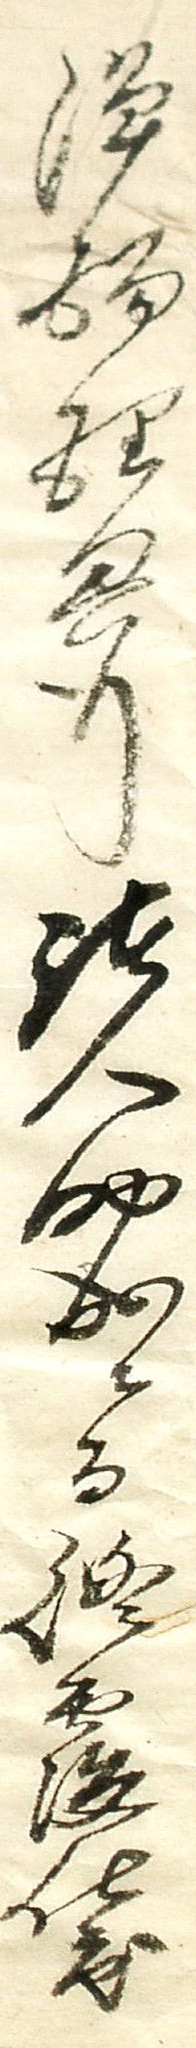浄瑠璃興行諸人助成ニ而修覆仕度
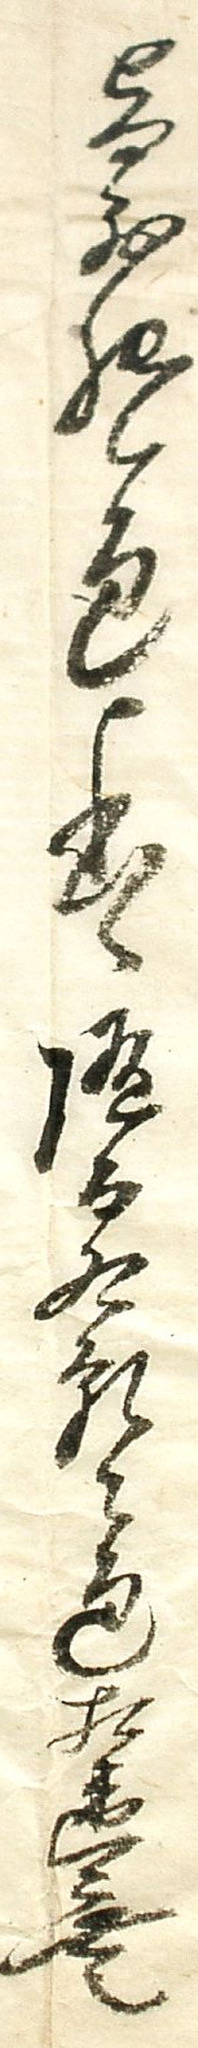旨別紙之通申出候随而右願之通相違無之
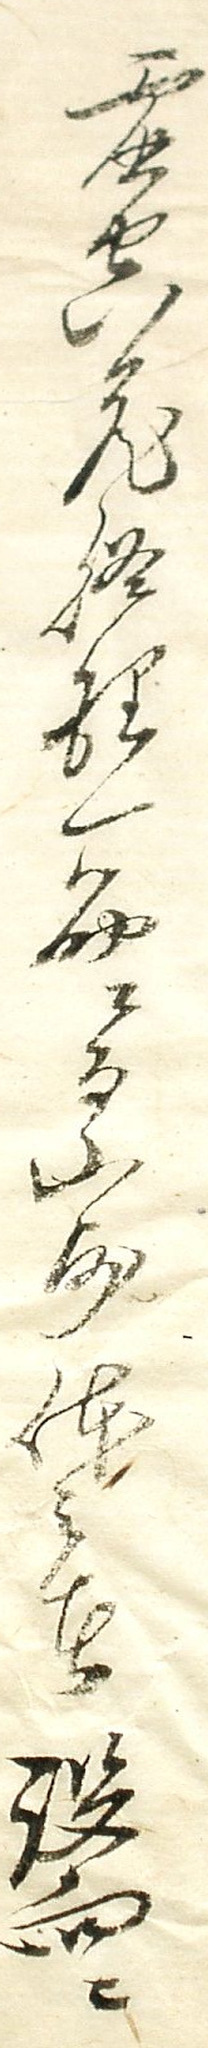虚空蔵修理一筋ニ而山師体之者役向ニ
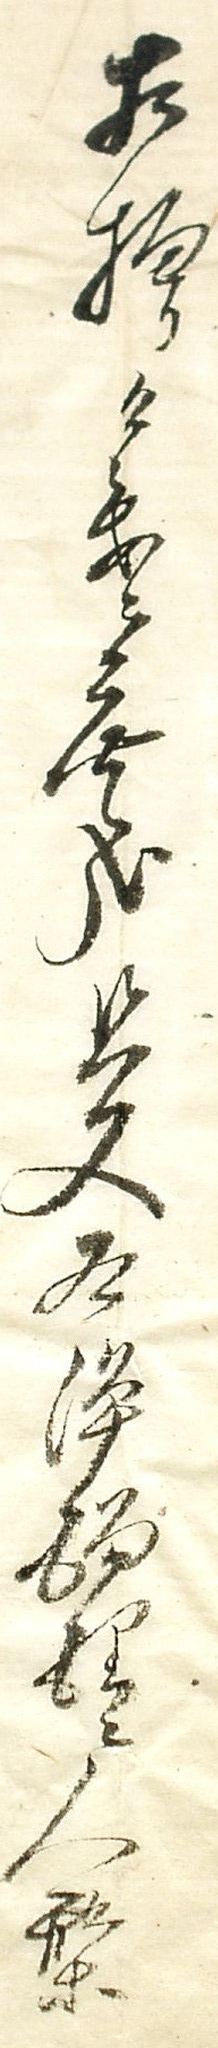相拘り候義ニ無之哉且又右浄瑠璃ニ人形等
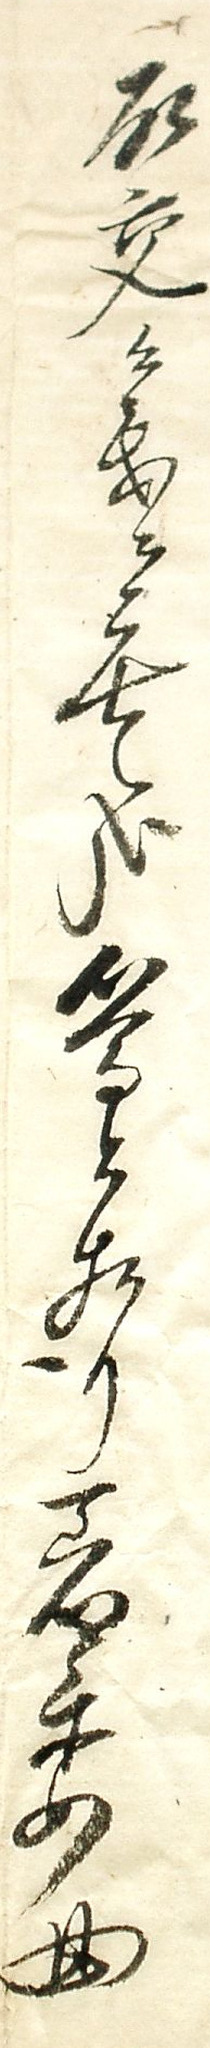取交候義ニ無之哉等と相行着委曲
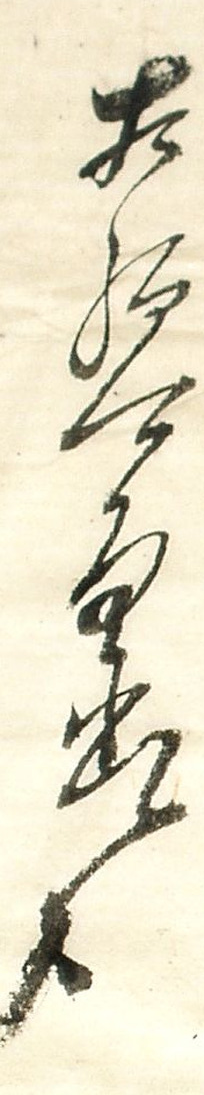相約可差出候以上
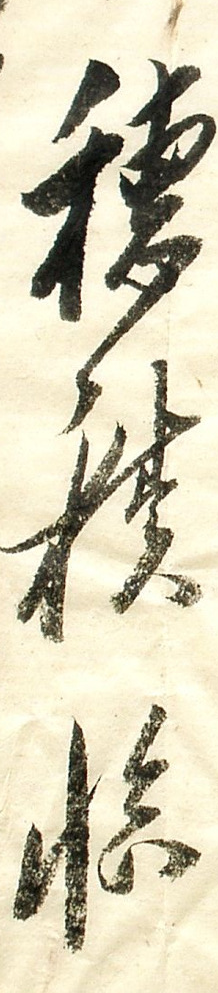穂積恰
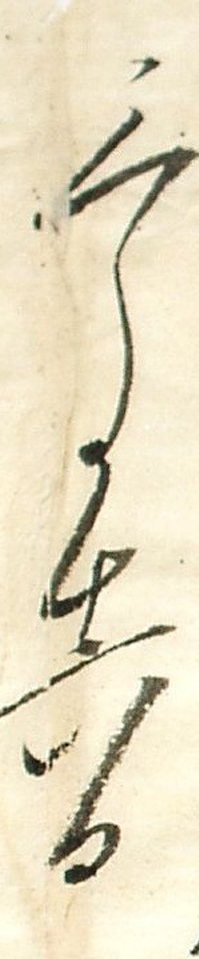三月十六日
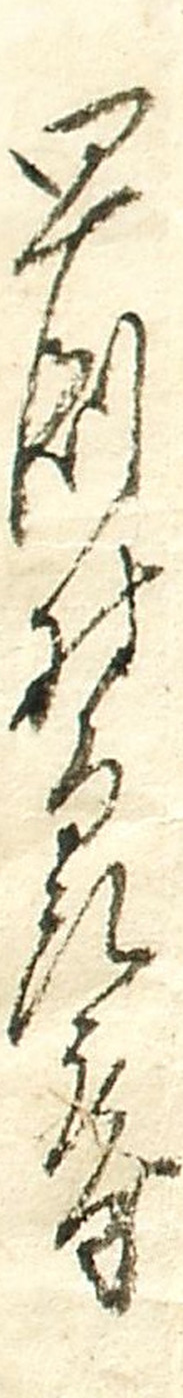早渕村与頭庄屋
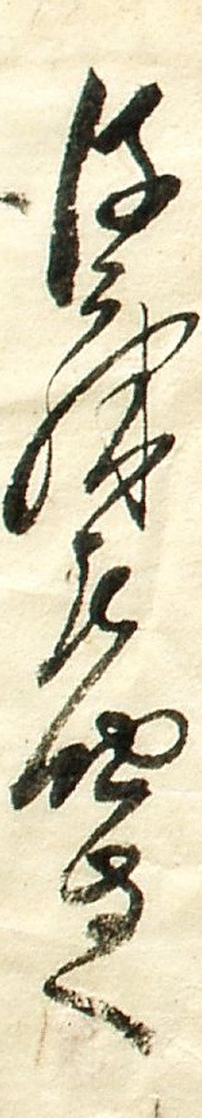後藤庄助方へ

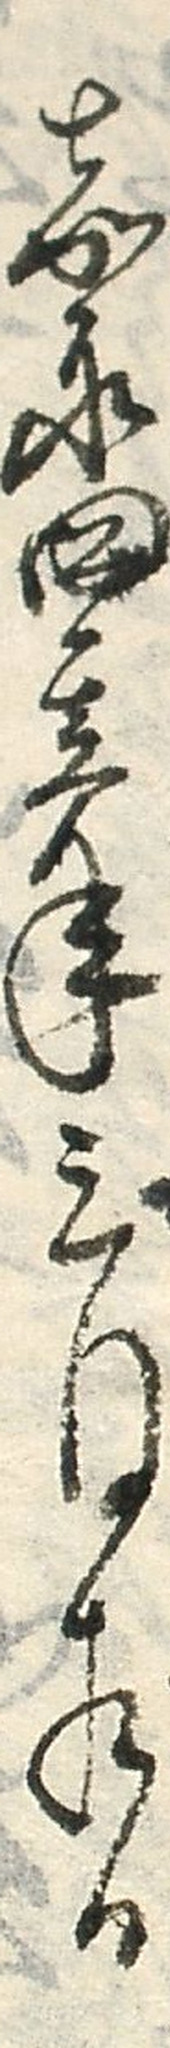嘉永四亥年三月十九日

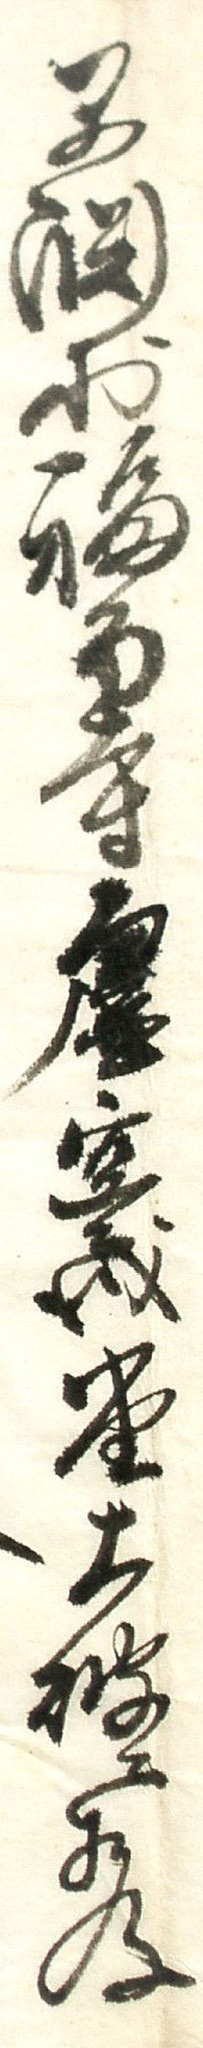早渕村福万寺虚空蔵堂大破ニ相及
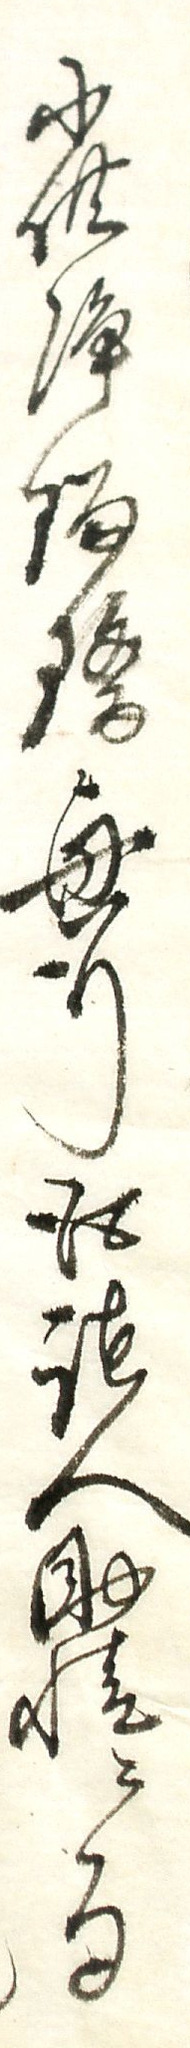小供浄瑠璃興行仕諸人助情ニ而
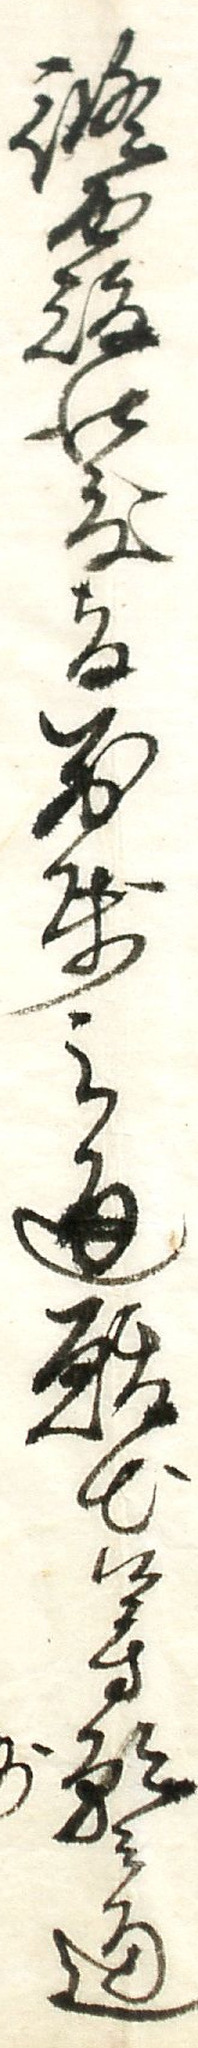修覆仕度旨別帋之通願出候ニ付願之通
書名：(早渕村福満寺子ども浄瑠璃願紙面）他
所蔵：鳴門教育大学 Naruto University of Education
